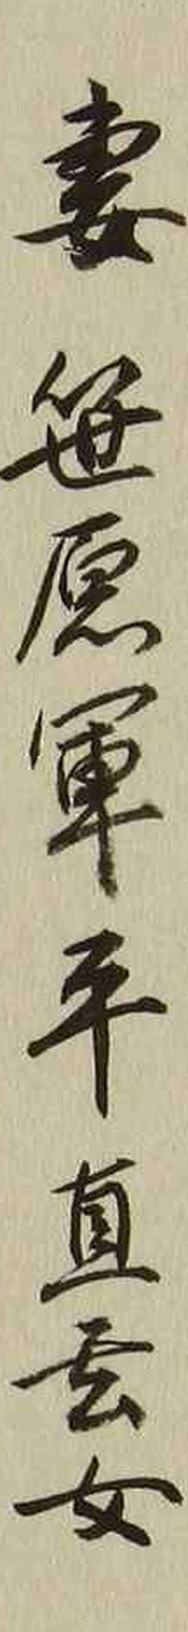妻笹原軍平直玄女
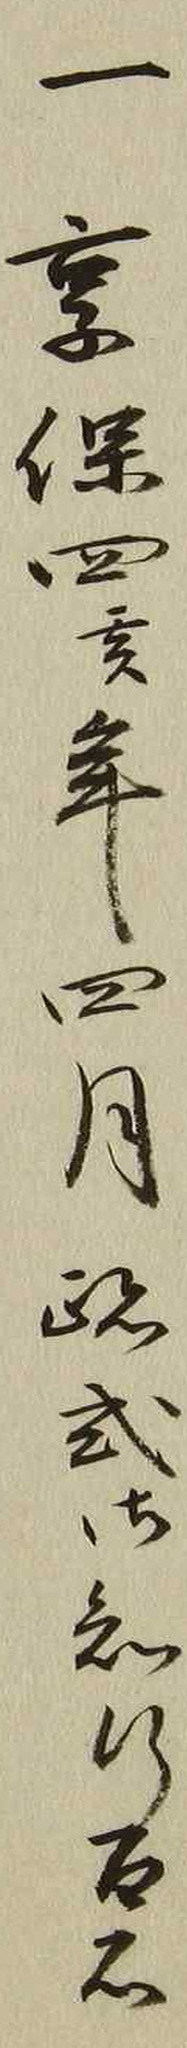一享保四亥年四月跡式御知行百石
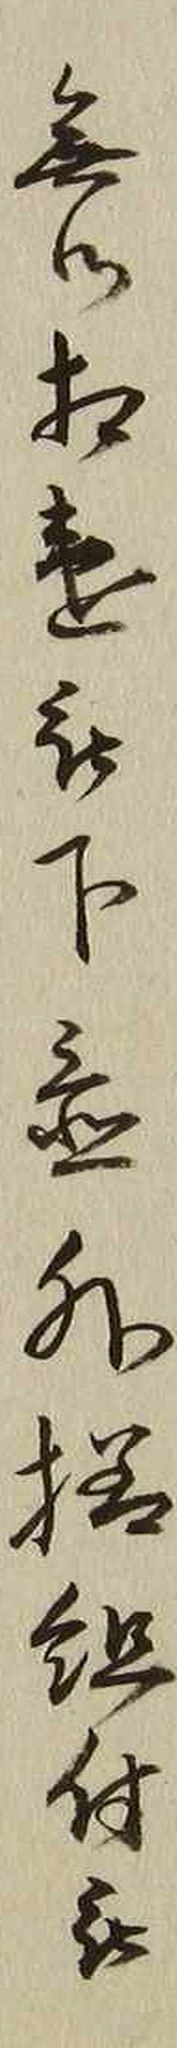無御相違被下置外様組付被
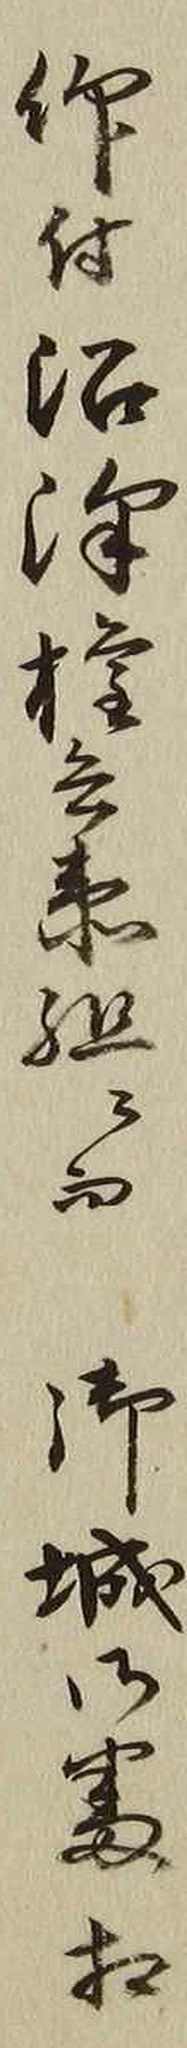仰付沼澤権兵衛組ニ而御城御番相
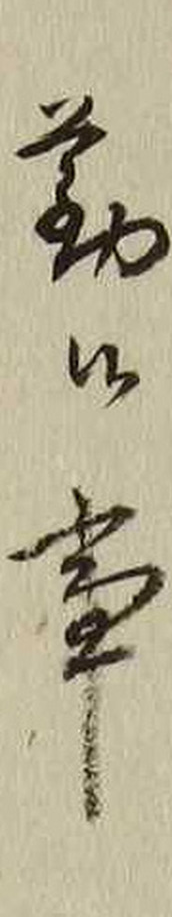勤候事
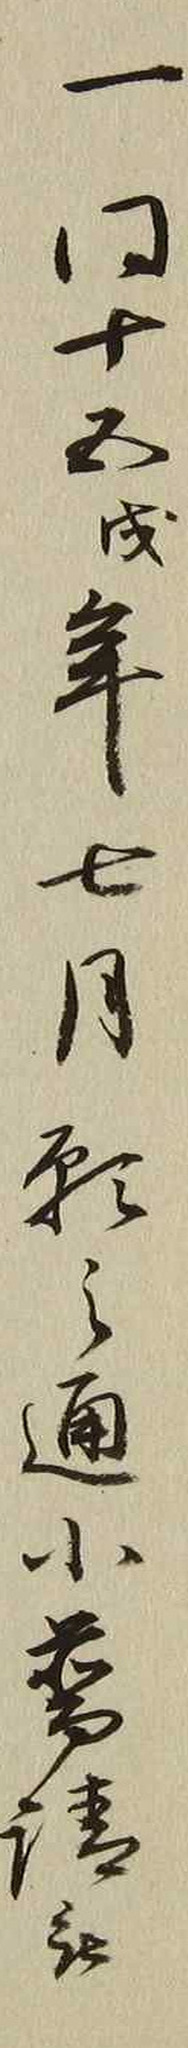一同十五戌年七月願之通小普請被
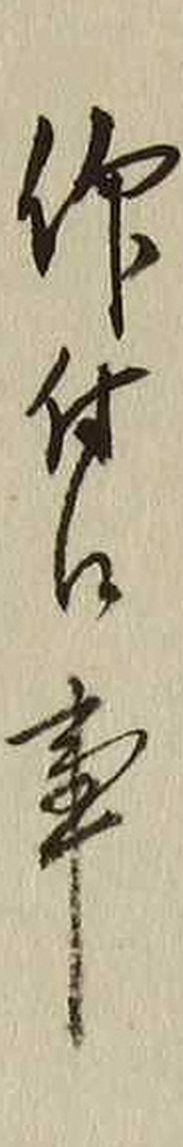仰付候事
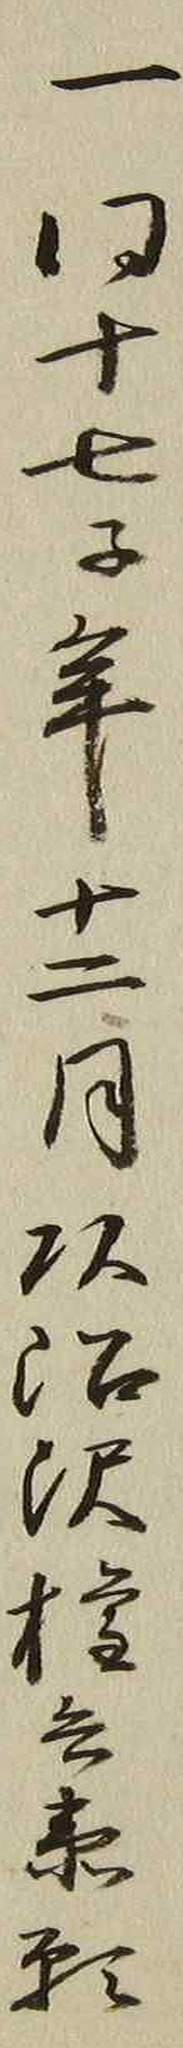一同十七子年十二月頭沼澤権兵衛願
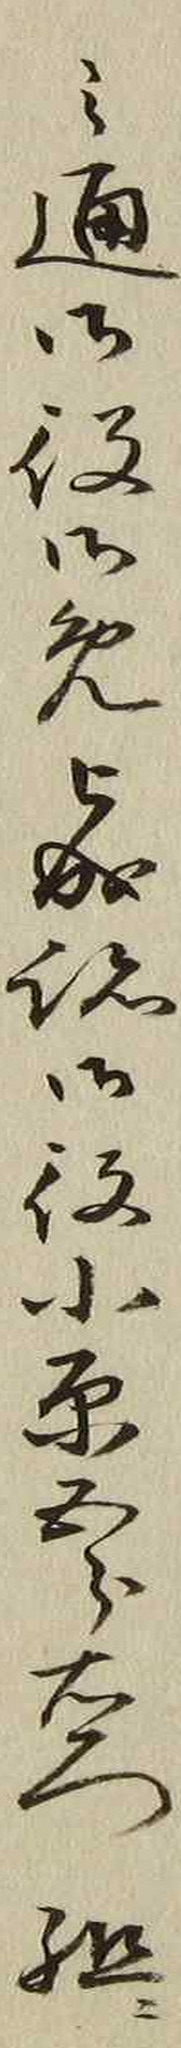之通御役御免被成跡御役小原五郎右衛門組ニ
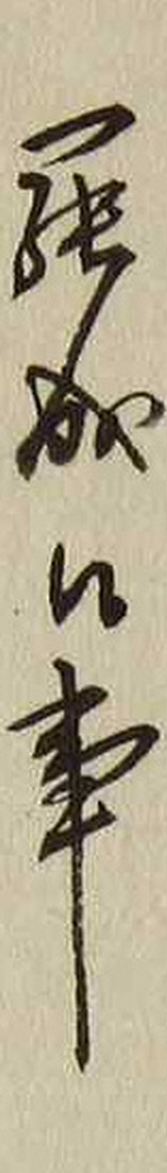罷成候事
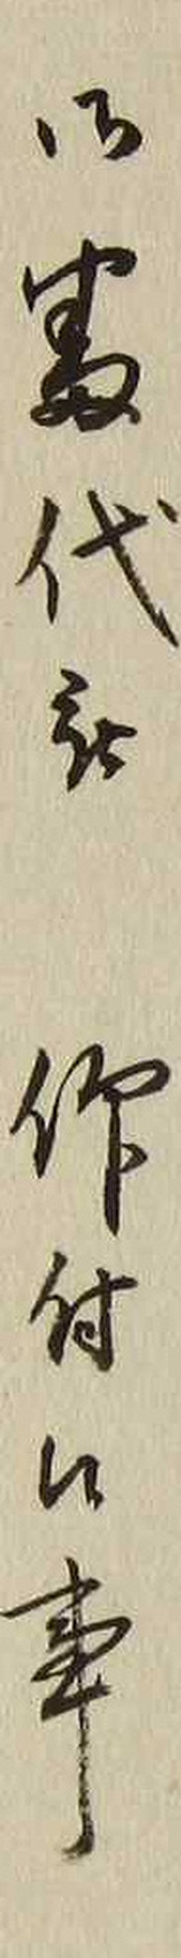御番代被仰付候事
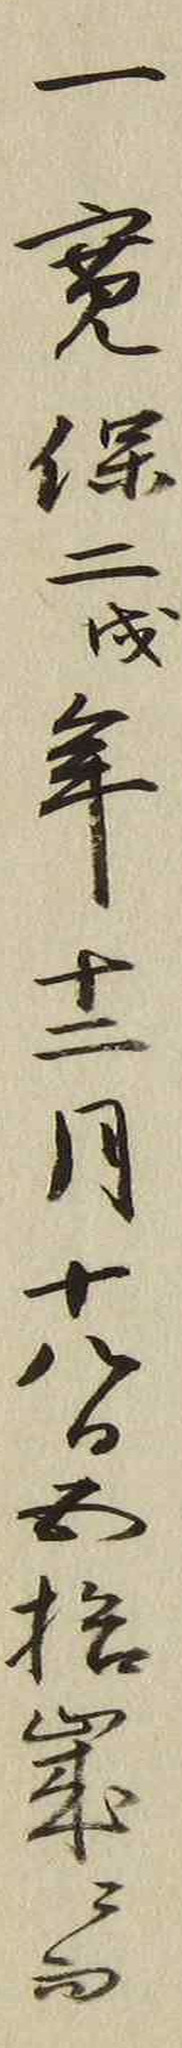一寛保二戌年十二月十八日五拾歳ニ而
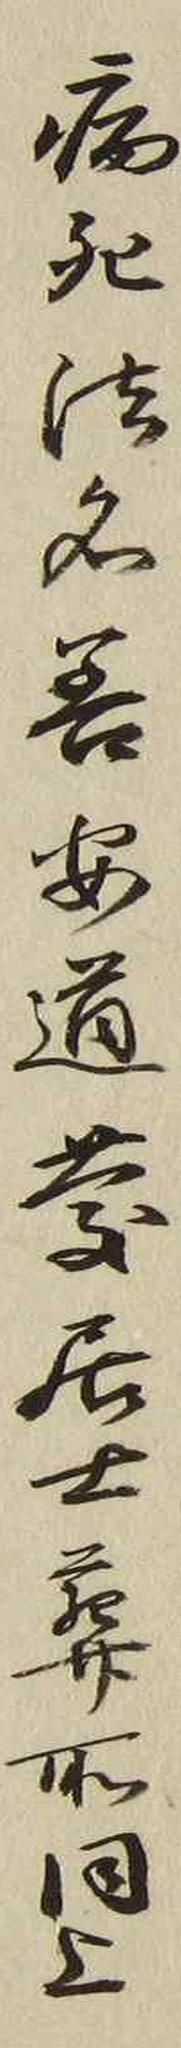病死法名善安道慶居士葬所同上

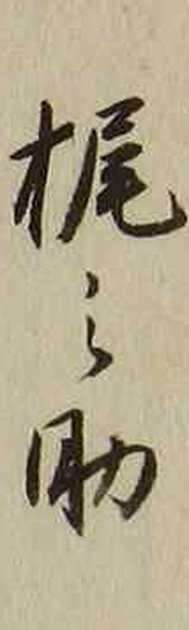梶之助
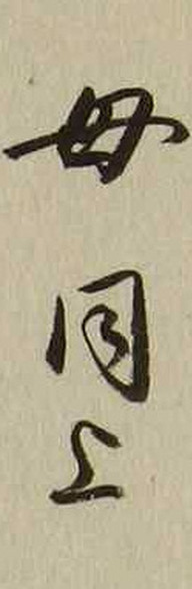母同上
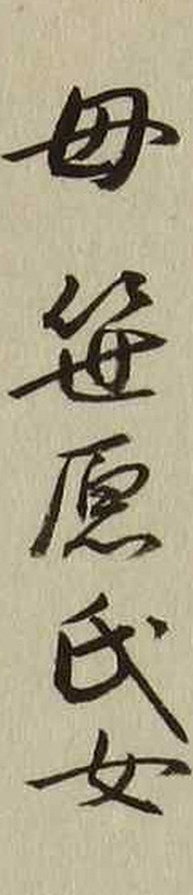母笹原氏女
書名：諸士系譜　巻之128　た之部4
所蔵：会津若松市立会津図書館
